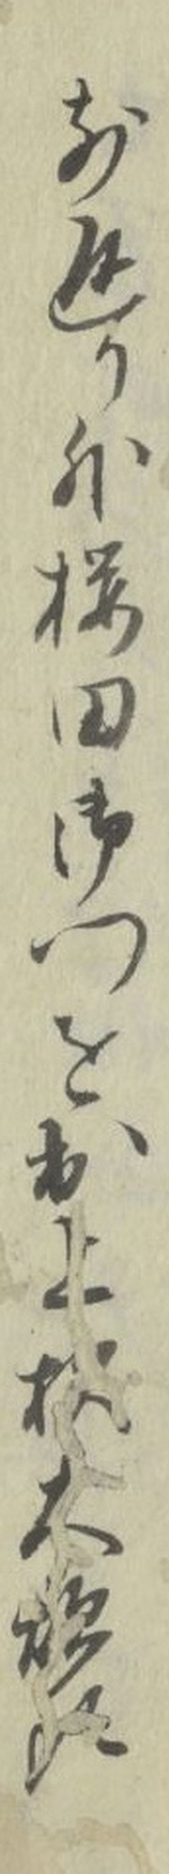前通り外桜田御門を出上杉大炊頭
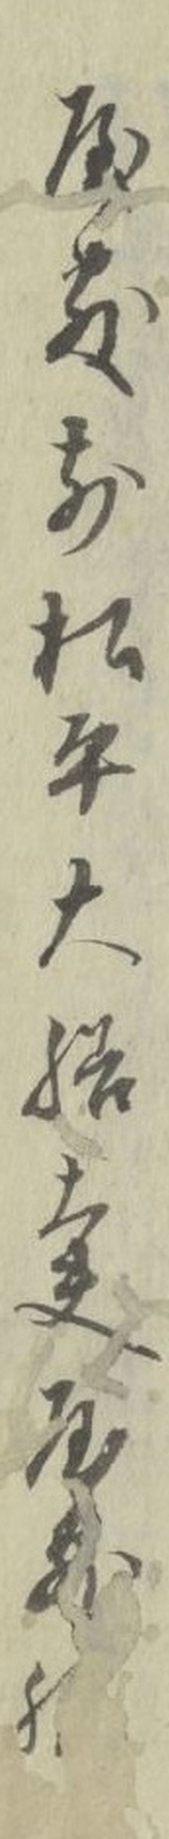屋敷前松平大膳大夫屋敷脇
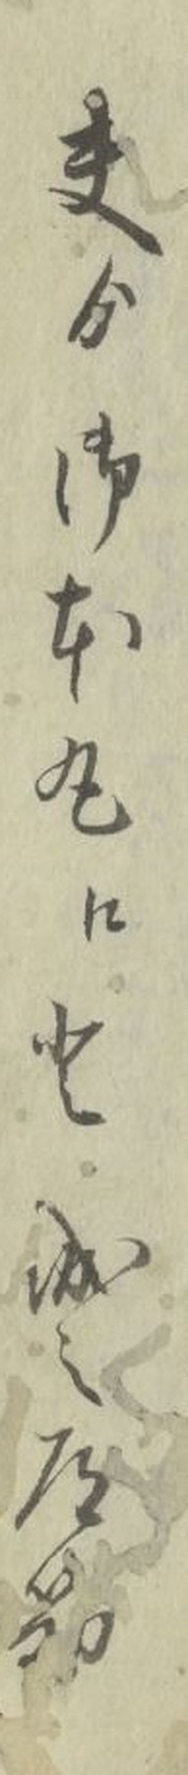夫ゟ御本丸え登城之道筋
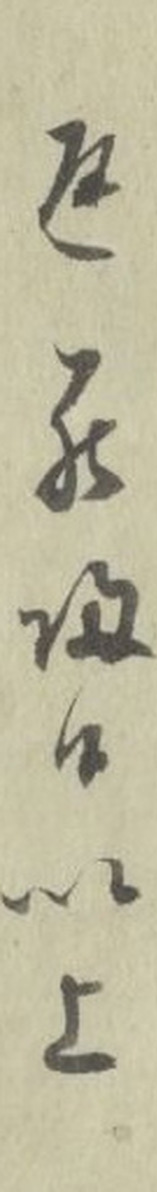通罷帰候以上

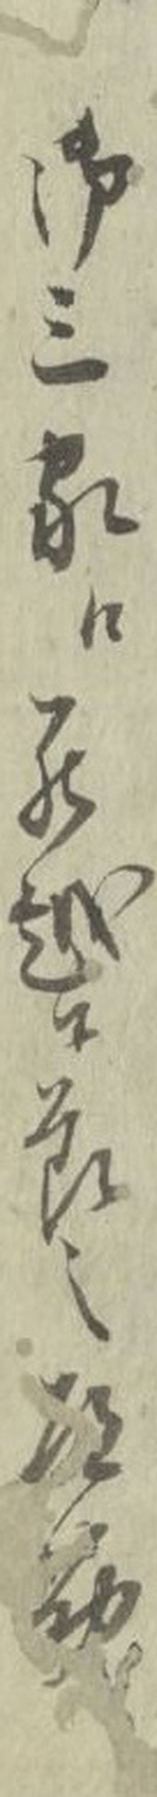御三家え罷越候節之道筋
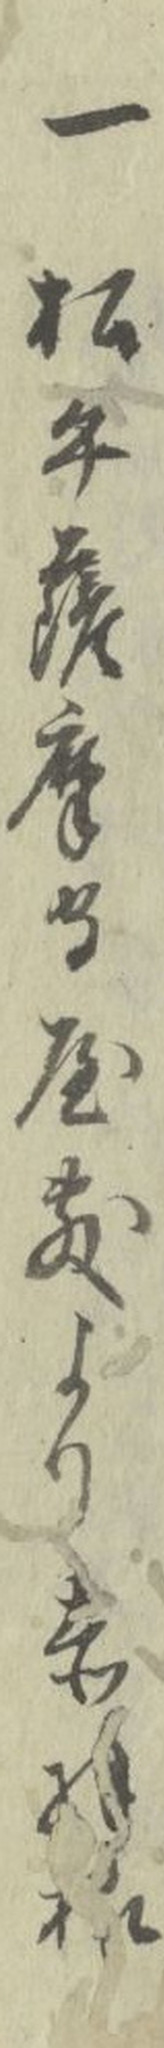一松平薩摩守屋敷より赤羽橋
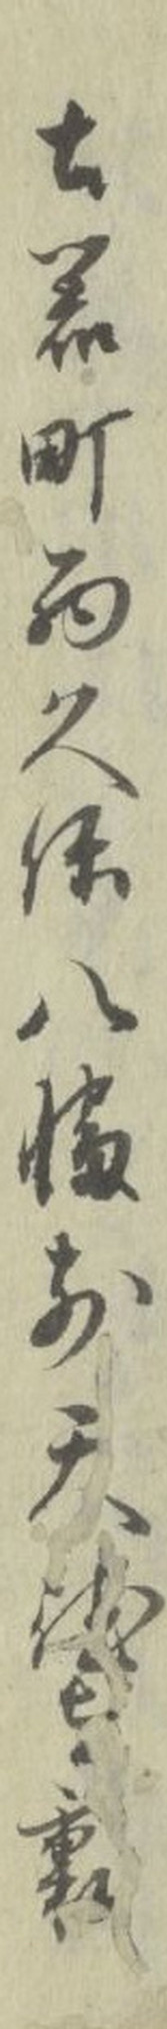土器町西久保八幡屋前天龍寺裏
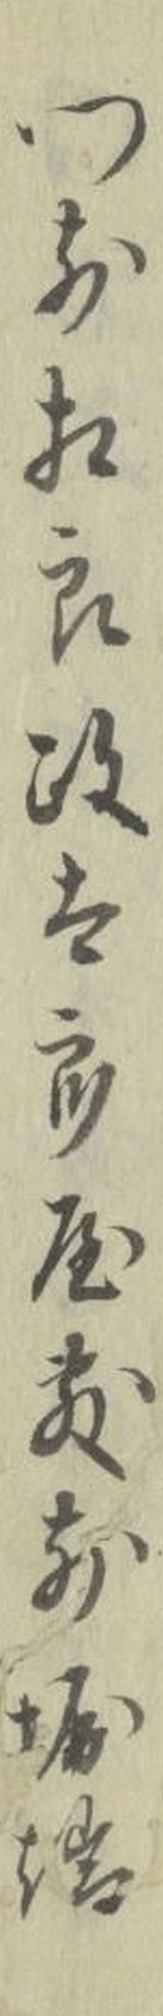門前相良政吉郎屋敷前堀端
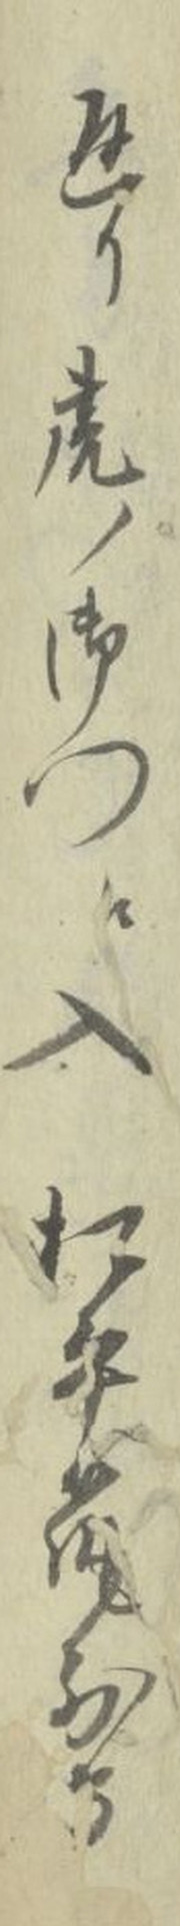通り虎の御門え入松平備前守
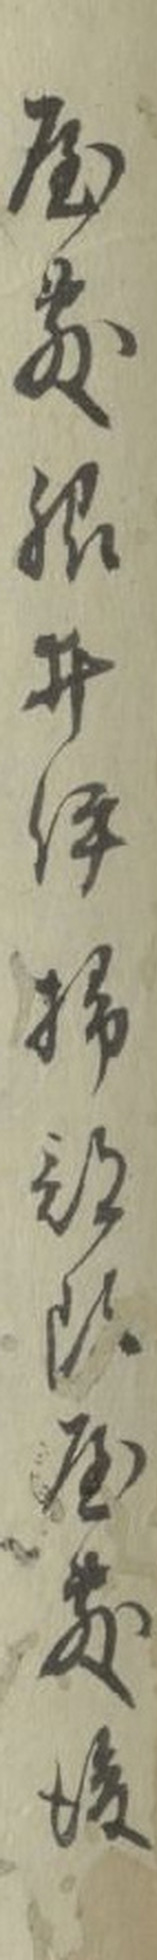屋敷脇紀伊掃部頭屋敷後
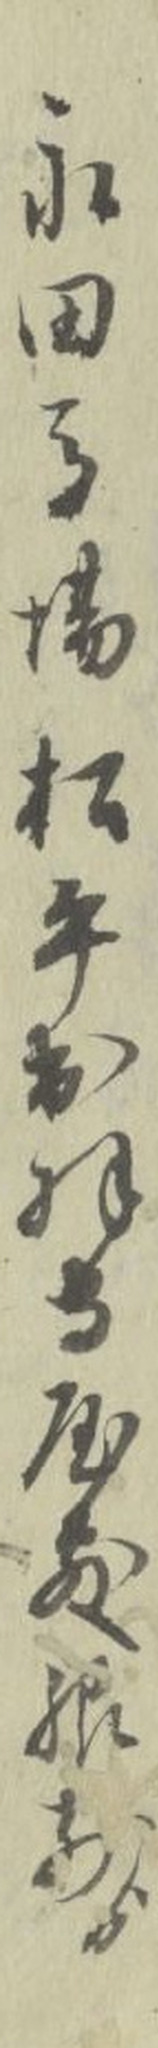永田馬場松平出羽守屋敷脇前ゟ
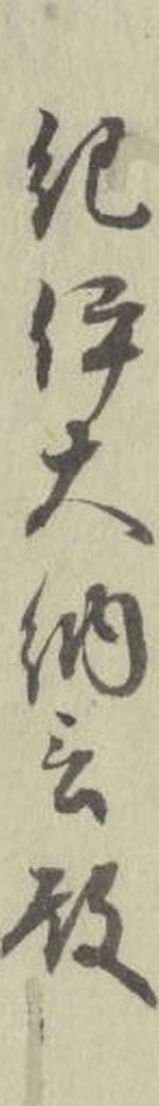紀伊大納言殿
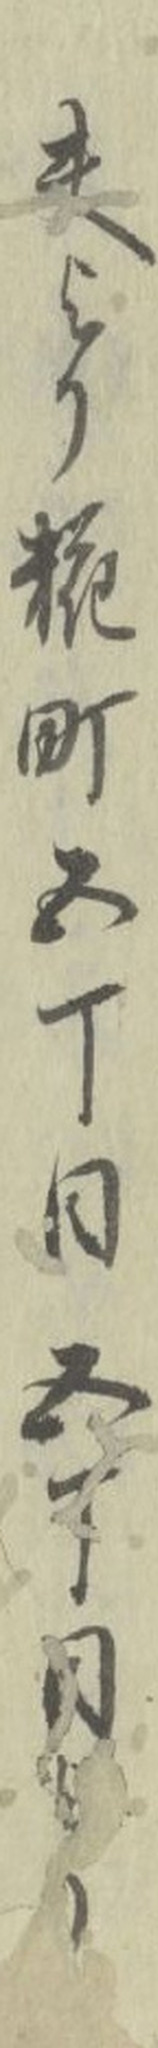夫より糀町五丁目五丁目より
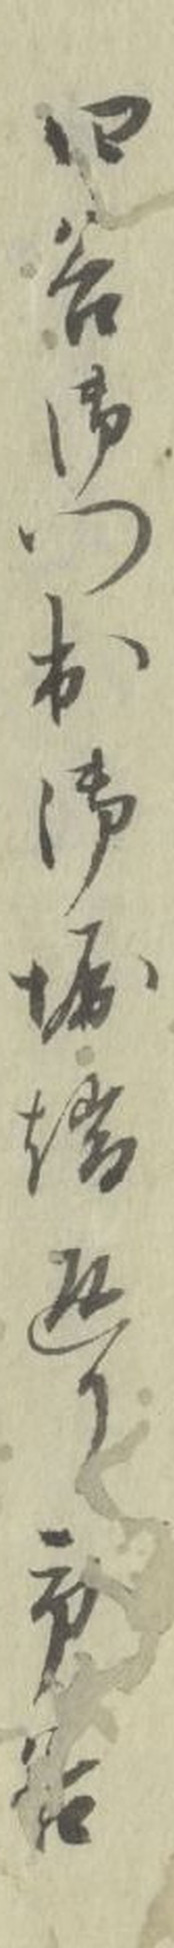四谷御門出御堀端通り市谷
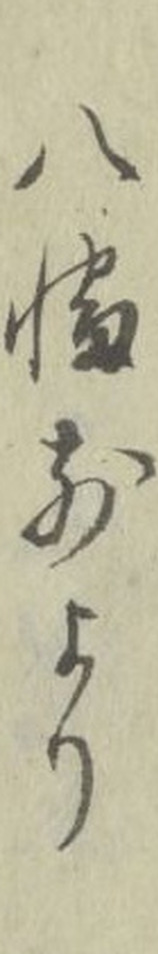八幡前より

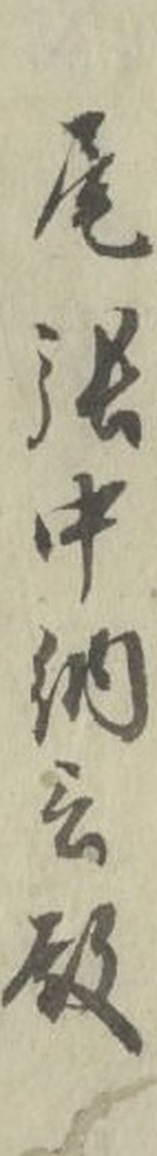尾張中納言殿
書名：琉球来朝記 自一至七
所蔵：University of the Ryukyus Library
